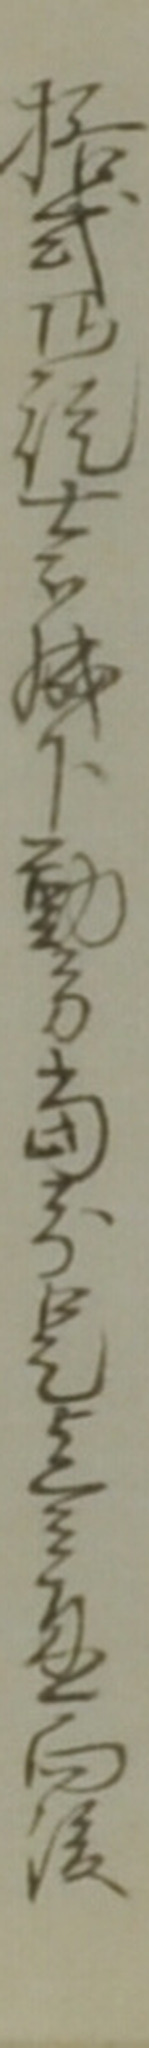格式御徒士被成下勤方当分是迄之通向後

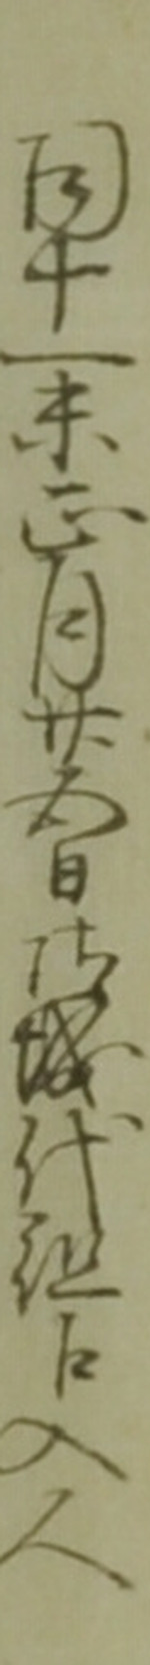一同十一未正月廿五日御城代組江入人
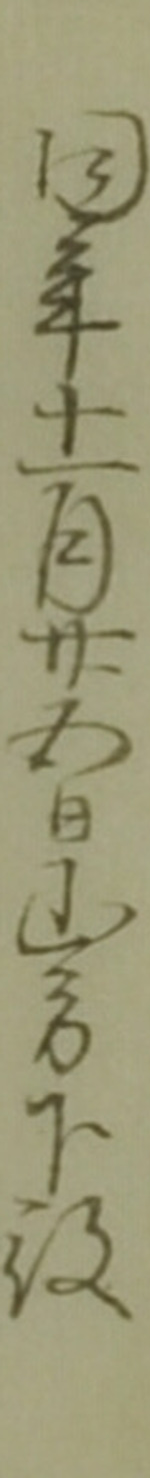一同年十一月廿五日山方下役
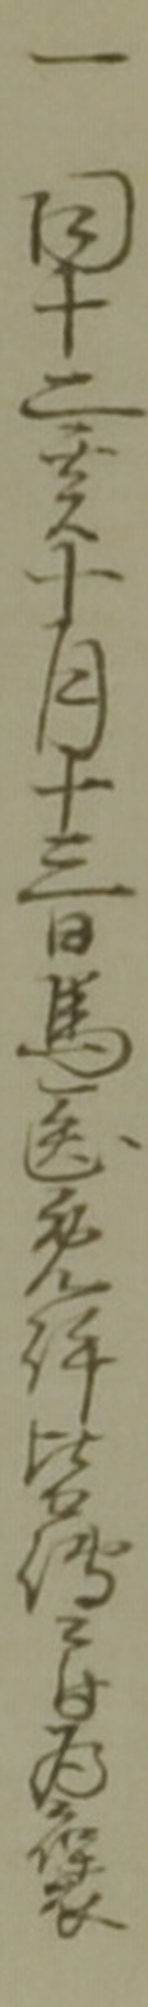一同十二亥十月十三日馬医免許皆伝ニ付為褒
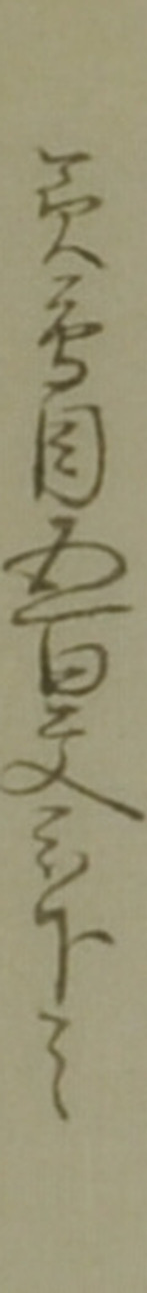美鳥目五百文被下之
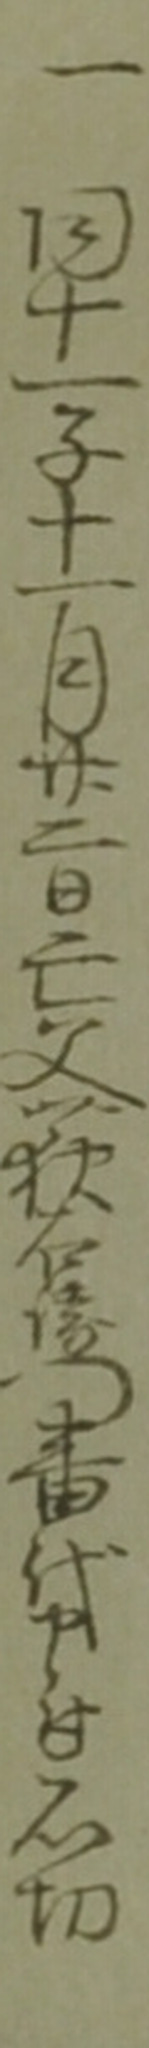一同十一子十一月廿二日亡父荻右衛門番代申付石切
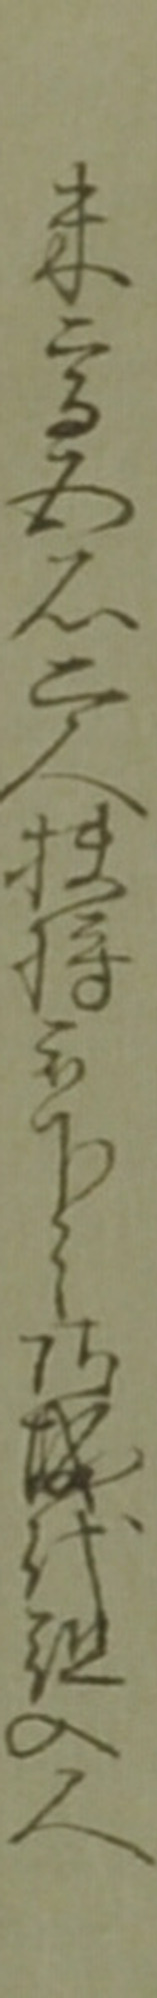米高五石二人扶持被下之御城代組入人
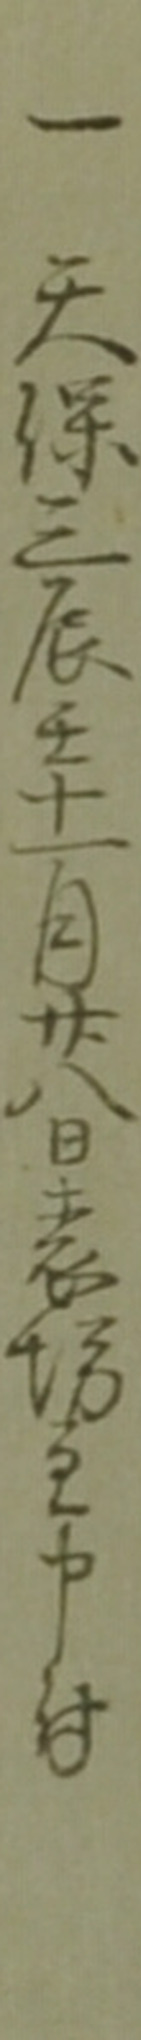一天保三辰閏十一月廿八日表坊主申付

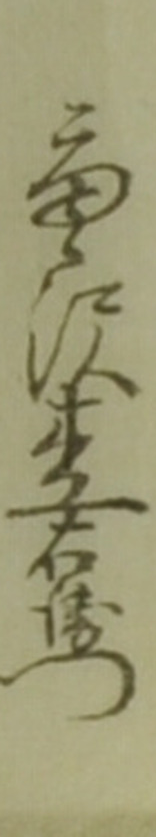唐沢走右衛門

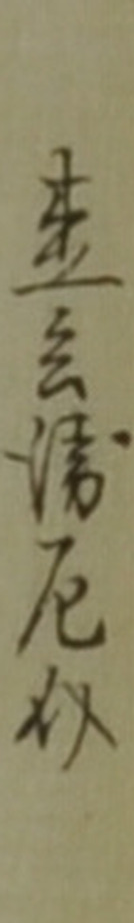杢兵衛厄介
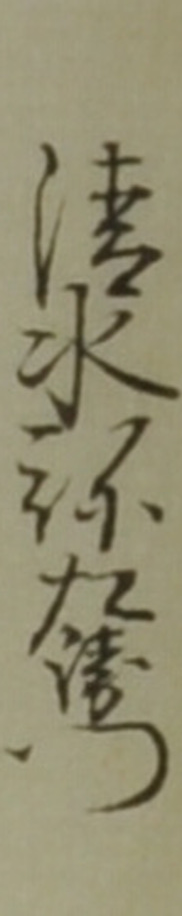清水祢左衛門
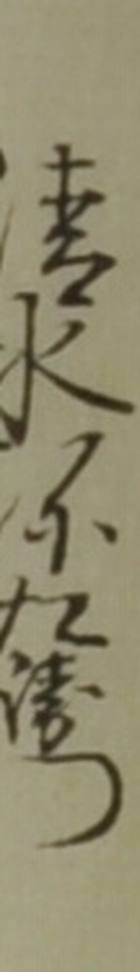清水祢左衛門
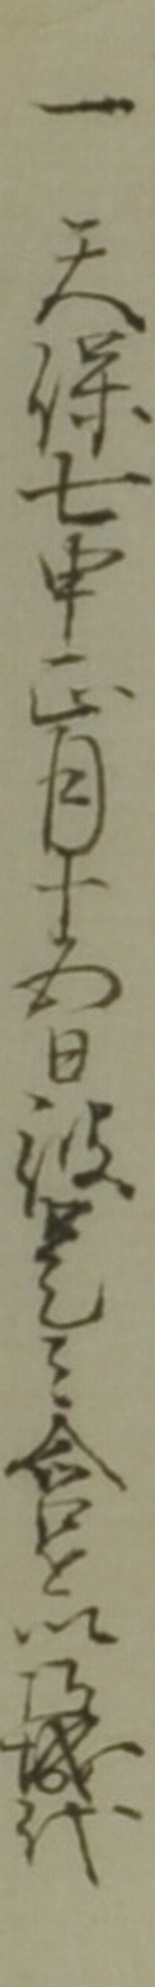一天保七申正月十五日彼是之含を以御城代
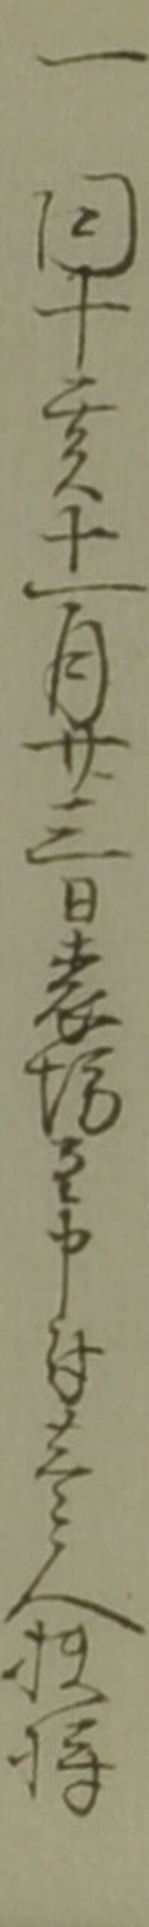一同十亥十一月廿三日表坊主申付壱人扶持
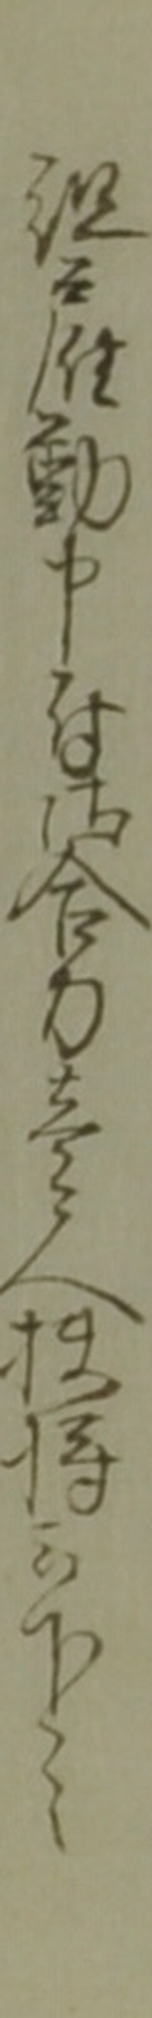組雇勤申付御合力壱人扶持被下之
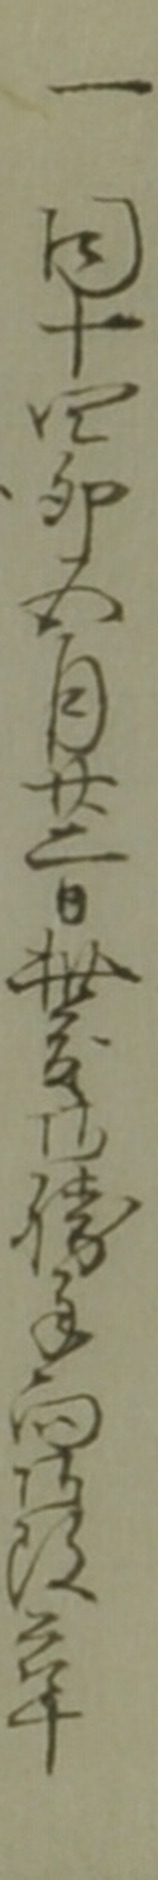一同十四卯五月廿二日此度御勝手向御改革
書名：無足諸士勤仕録（九）
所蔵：伊那市立高遠町図書館・合同会社AMANE
